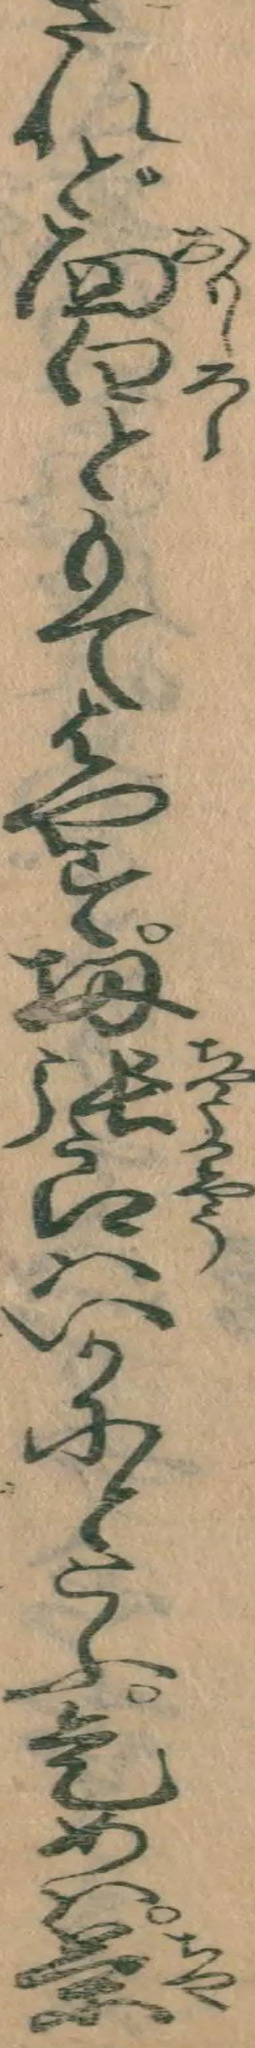されど面白ともてはやす。扨張良はいかにととふ。是めは。茶
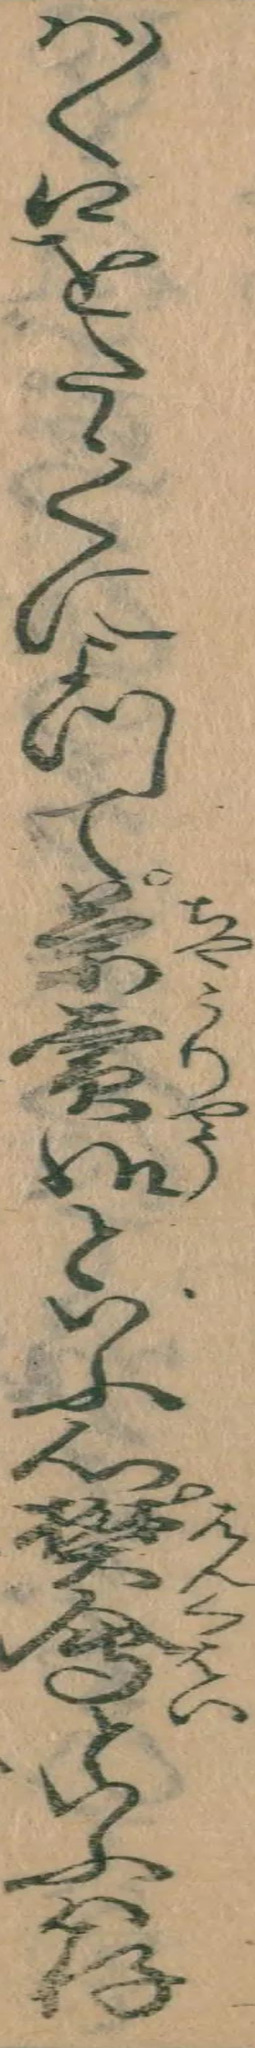は〳〵口をたゝくによつて。茶売様といふ心。焚会といふは存
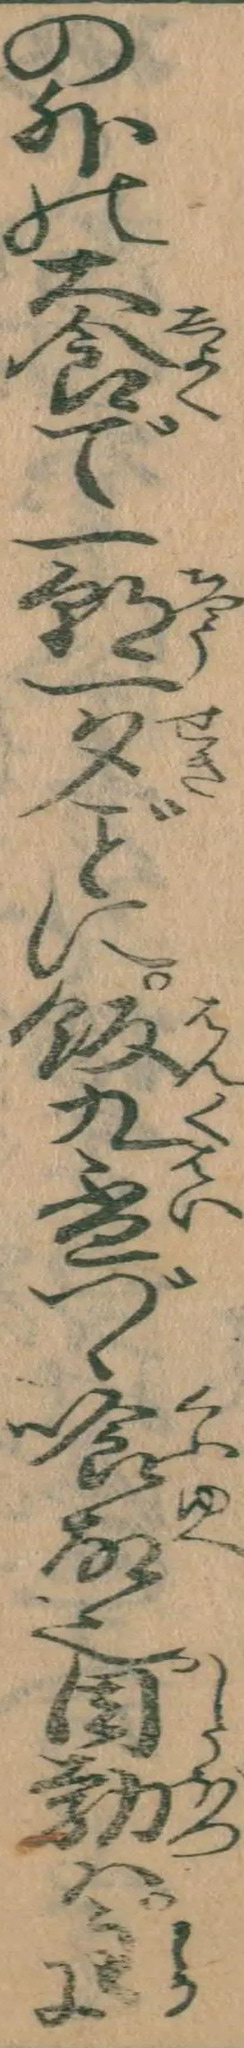の外の大食で一朝一夕ごとに飯九杯づゝ喰故也。周勃は。主に
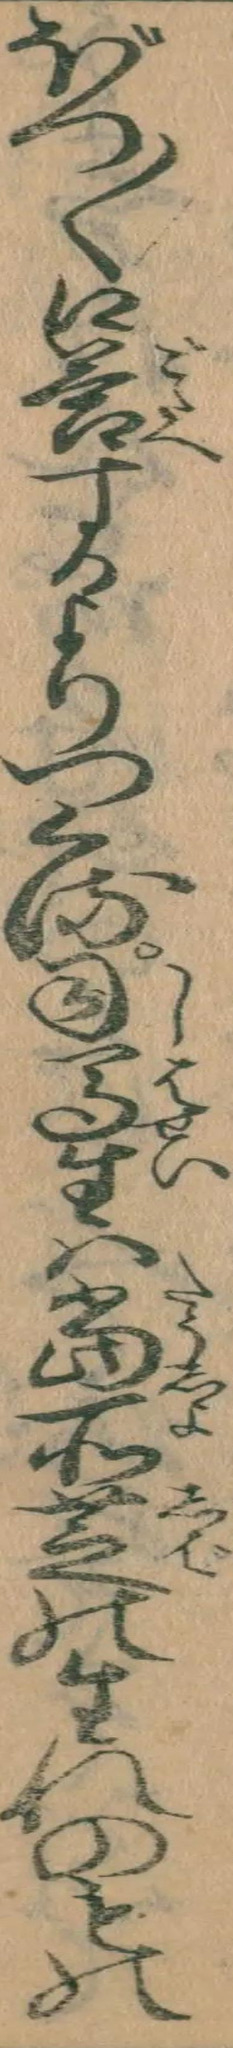ぼつ〳〵口答するよりつくる。司馬生は当所芝の生れのもの
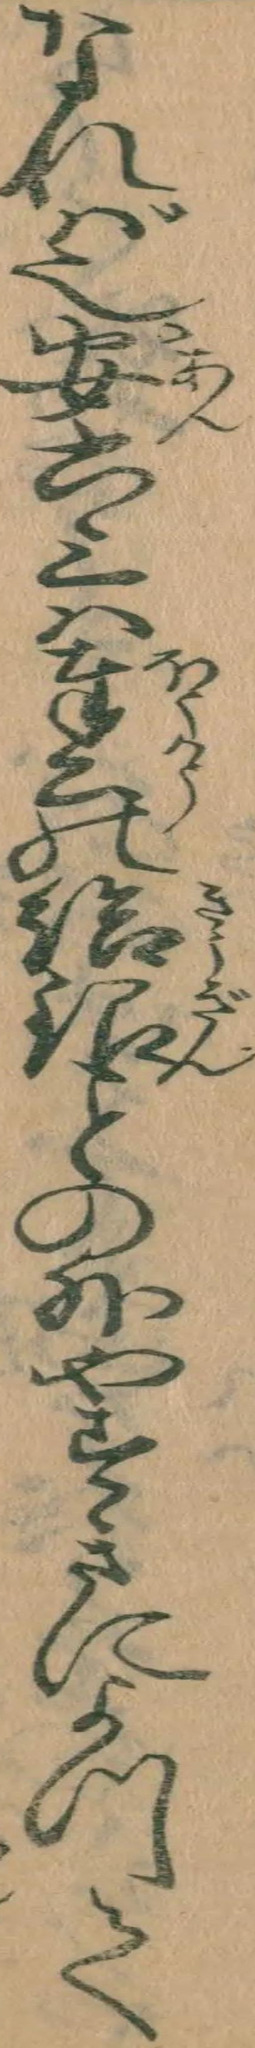なれば也。安六三は奉公の給銀ことの外やすきによつて
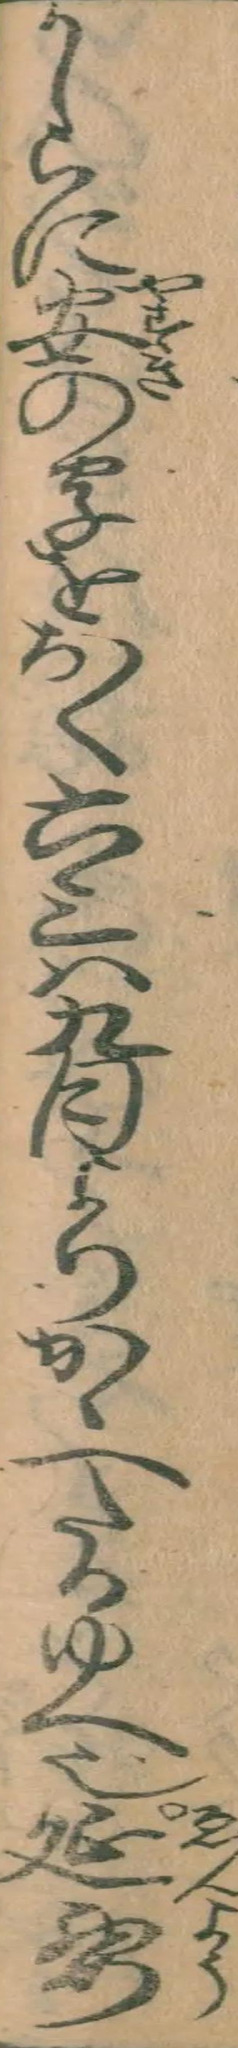かしらに安の字をおく六三は九月よりかゝへたるゆへ也。延要
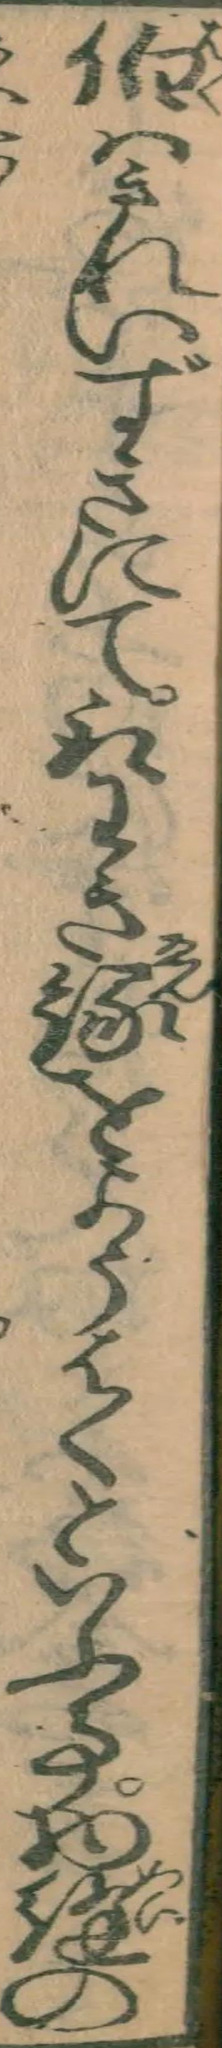伯はきれいずきにて。取わき縁をようはくといふ事。物縫の
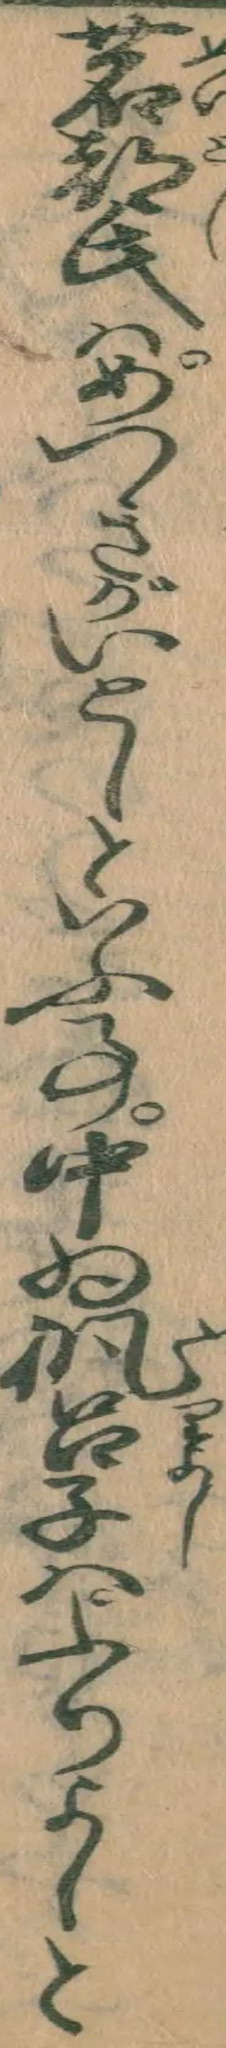茗都氏は。めつきがいとしといふ事。中ゐ楓呂子は。ふりよしと
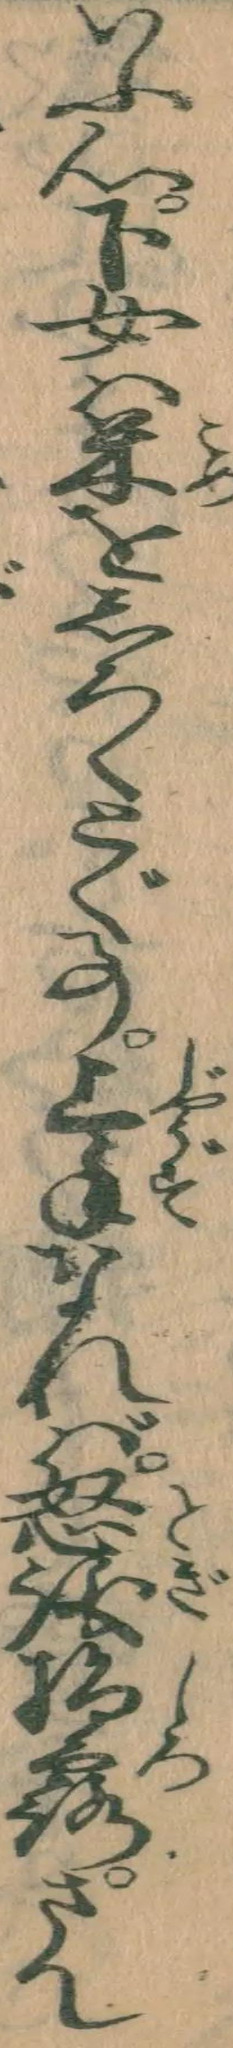いふ心。下女は米をしろくとぐ事。上手なれば。怒議指露。さて
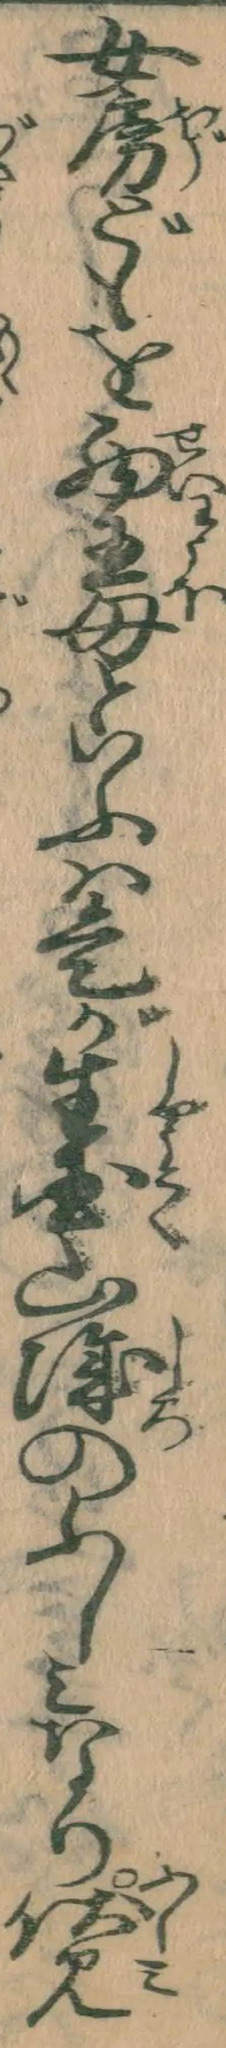女房どもを西王母といふは是が生国山城のふしみなり。伏見
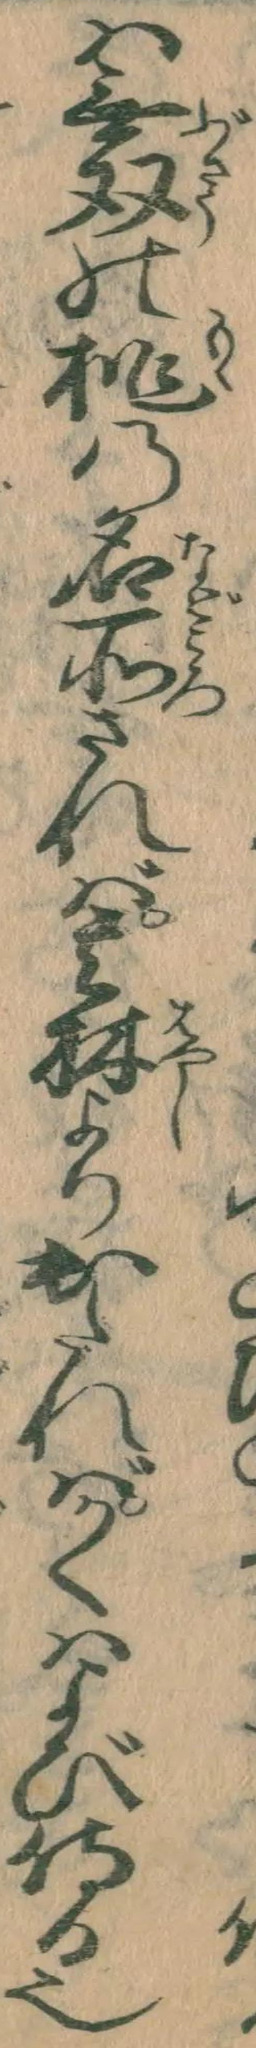は無双の桃の名所されば。其林より出たれば。かくはよび侍る也
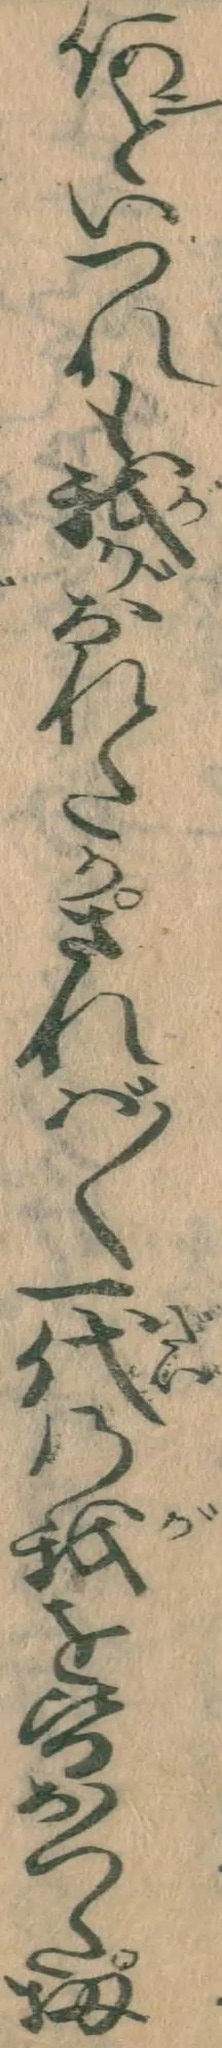何我がおれたか。されば〳〵一は代の我を皆おつた。扨
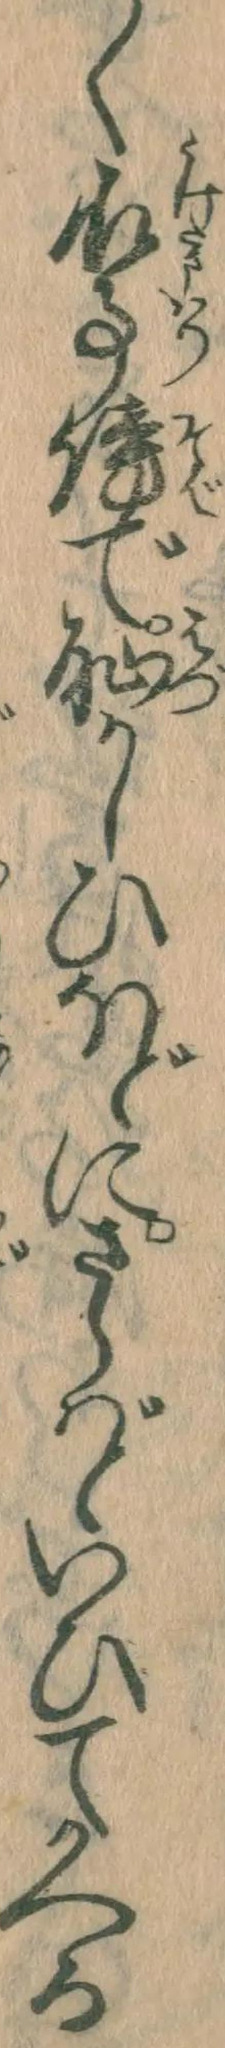々承事傍で。恥かしひほどに。さらばといひてかへる
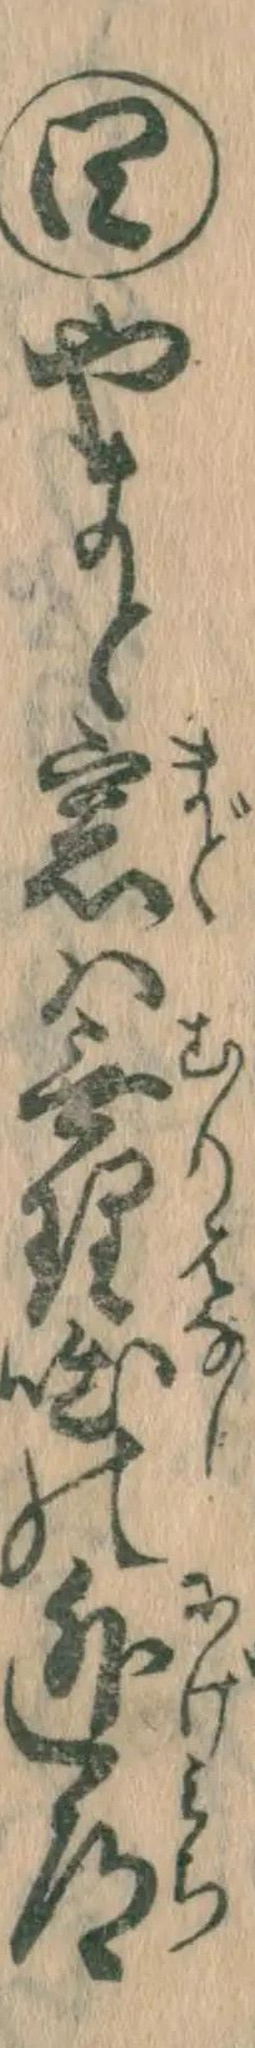四やまと窓は無理咄の逃道
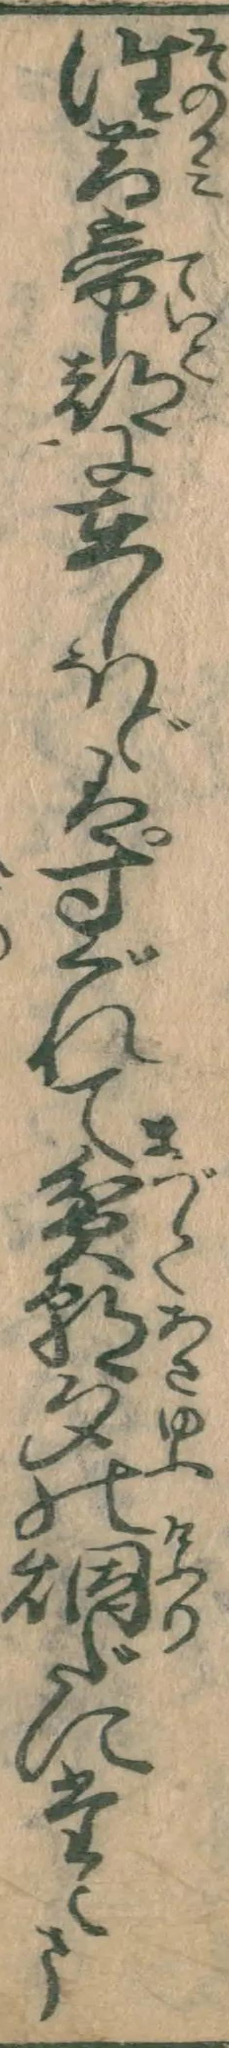往昔帝都に在しほどは。すぐれて貧朝夕の煙だにたえま
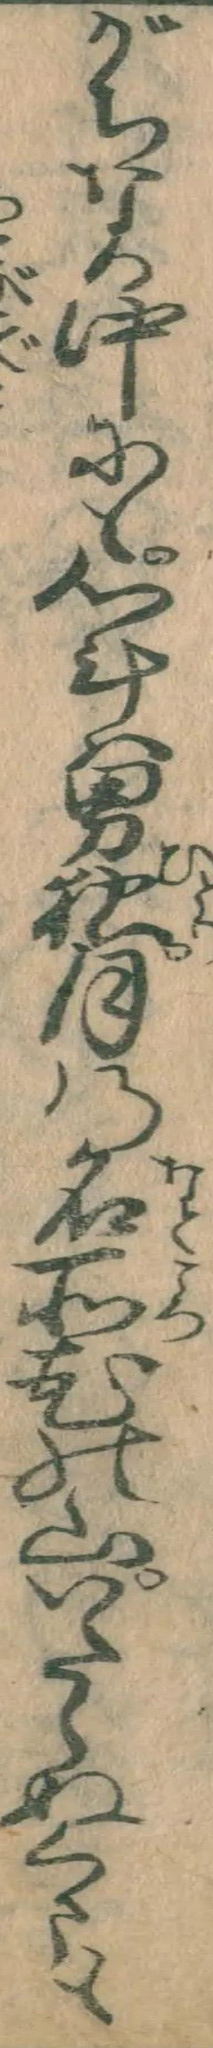がちなる中にも。心計は男独。月の名所花の山。いたらぬくまも
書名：新竹斎 5巻
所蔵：国立国会図書館 National Diet Library, JAPAN
